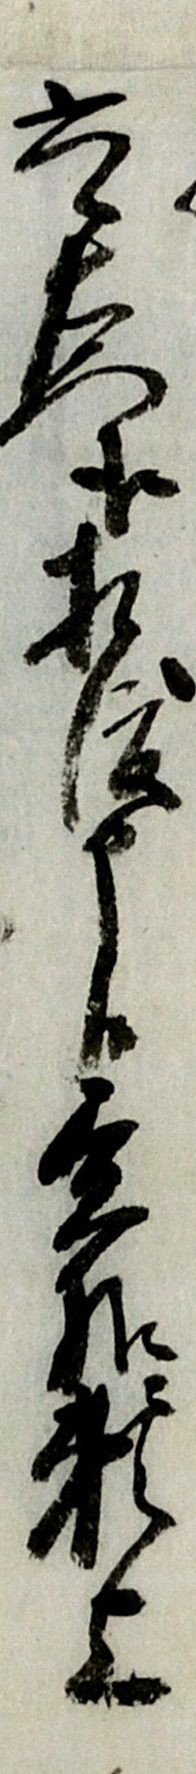六郎右衛門へ相渡申候宜様に頼上
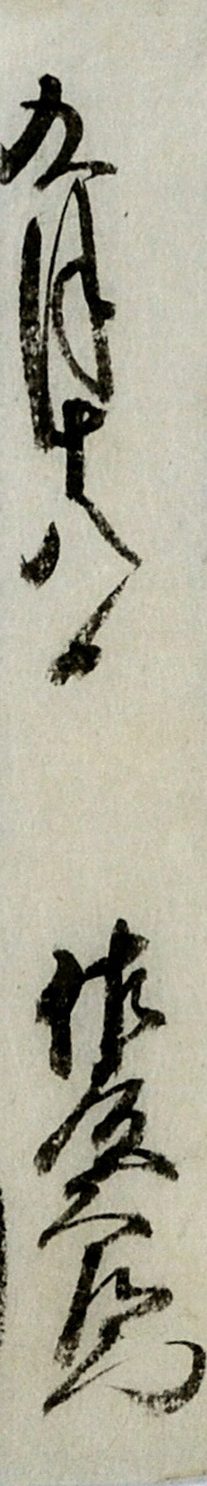九月十八日佐藤左衛門判
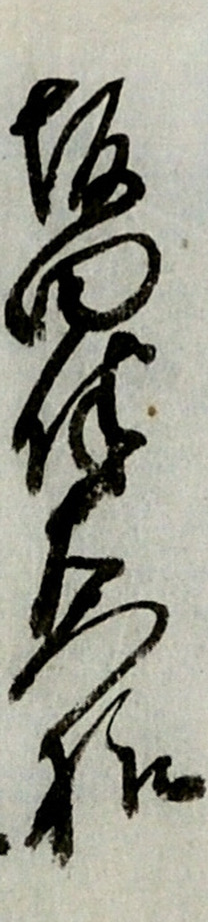飯田伴右衛門様
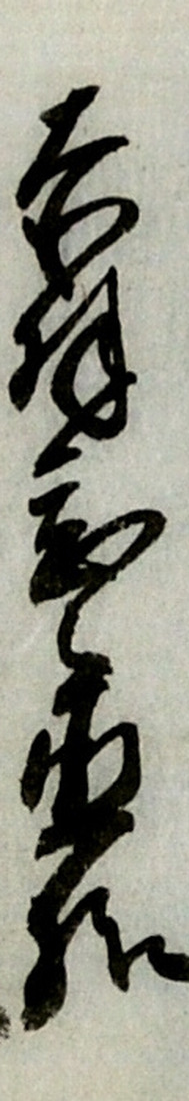赤羽甚之丞様
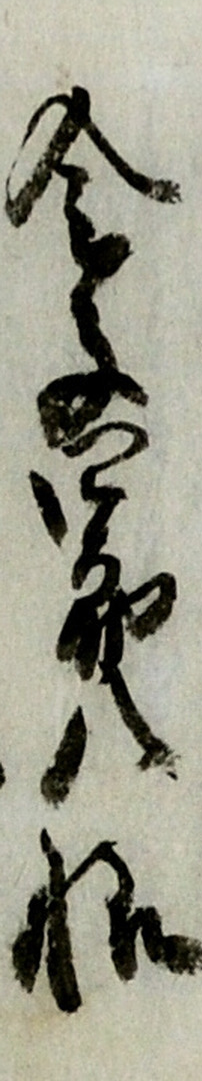金子四郎八様
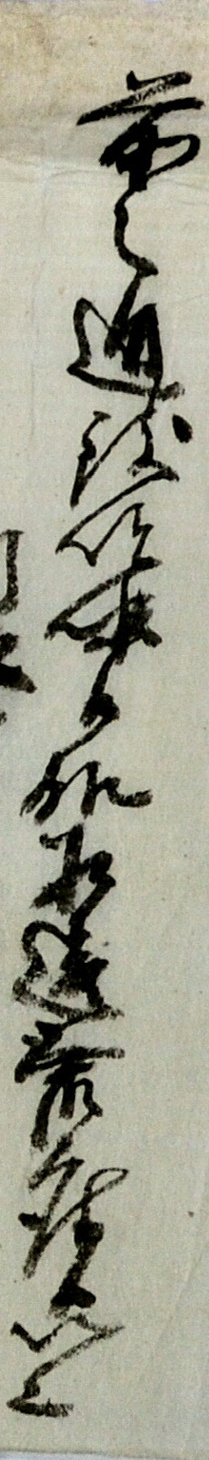前之通致吟味候処相違無御座候以上
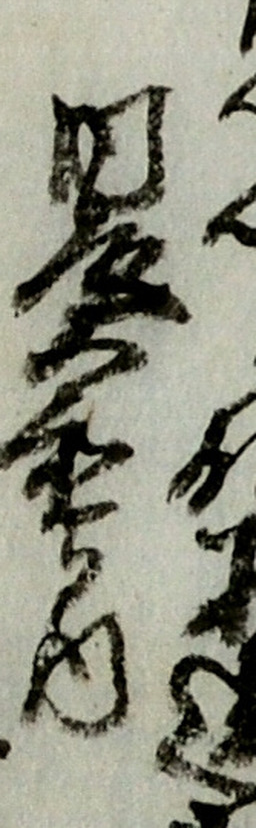内藤大和守内

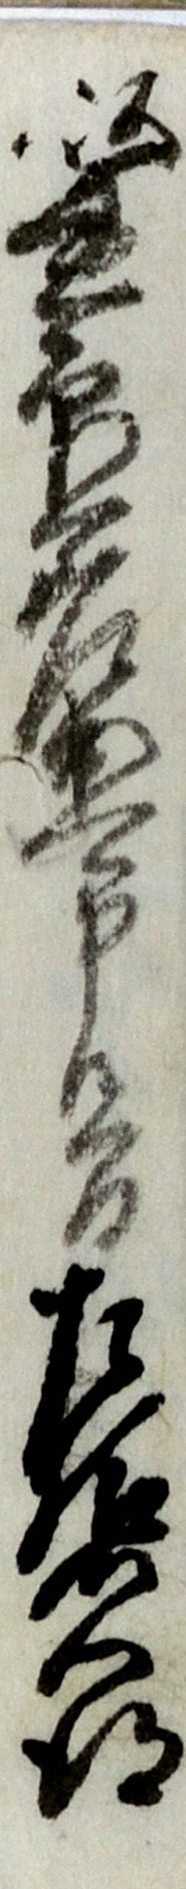以通印差出可申候間左様御心得
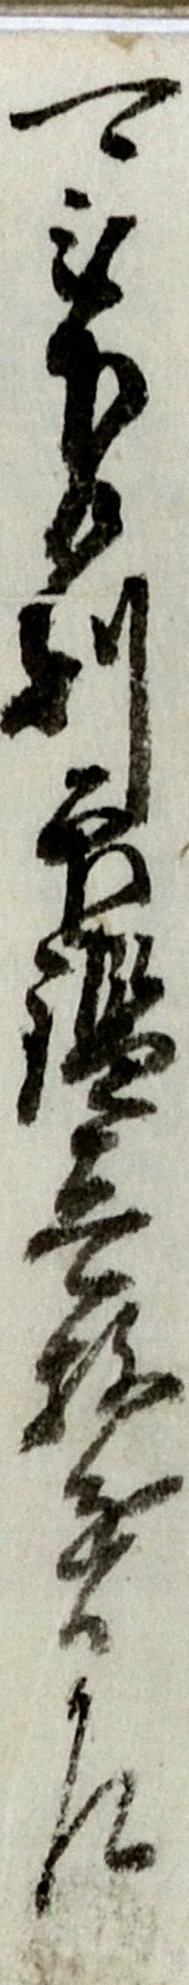可被下候則印鑑壱枚近日乍
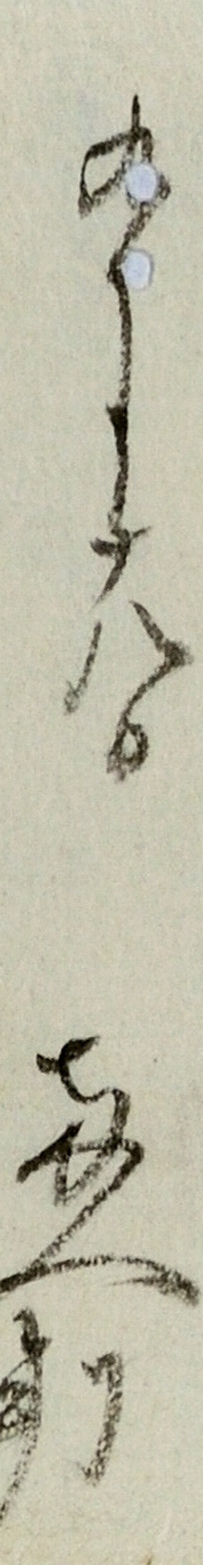九月十八日両人判
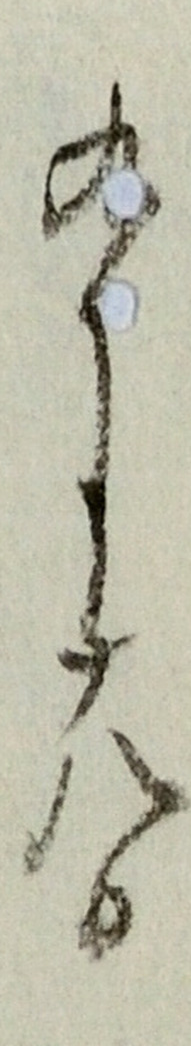九月十八日
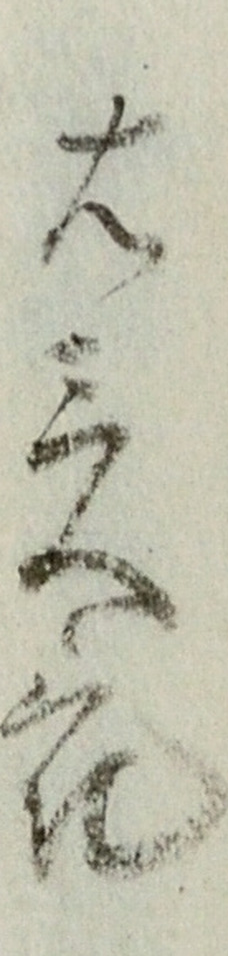右三人衆
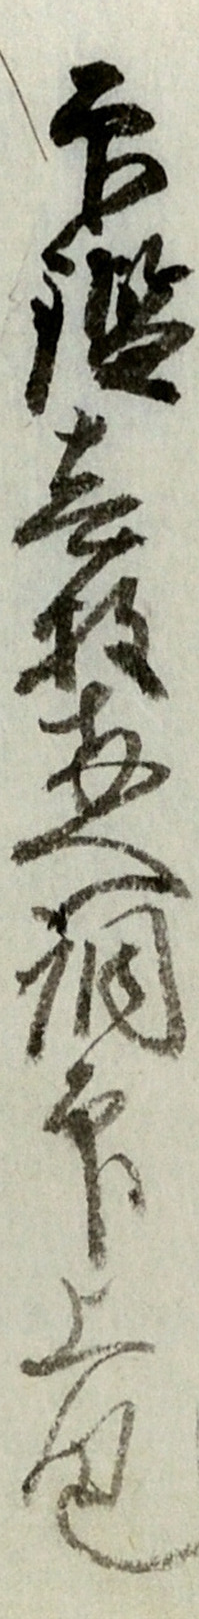印鑑壱枚両人調印上包
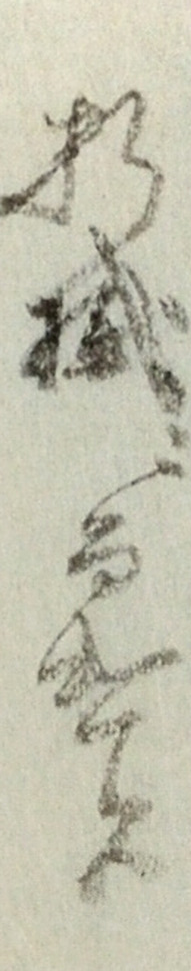折掛に而遣候
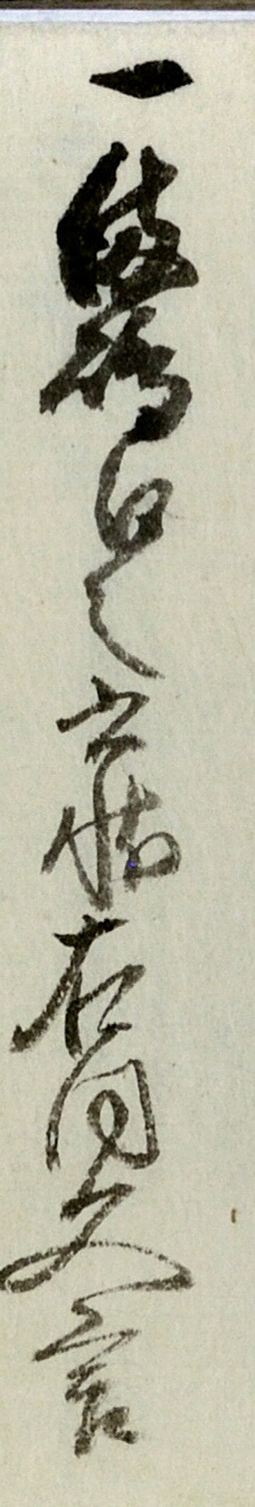一満嶋え之書状右同文言
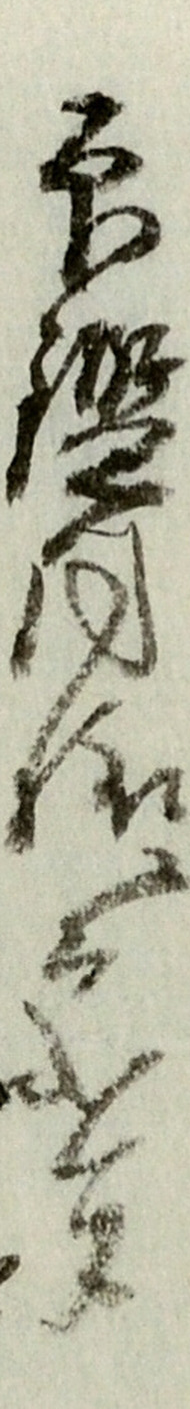印鑑同様ニ而遣候
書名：分一方諸事御用留帳
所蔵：伊那市立高遠町図書館・合同会社AMANE
